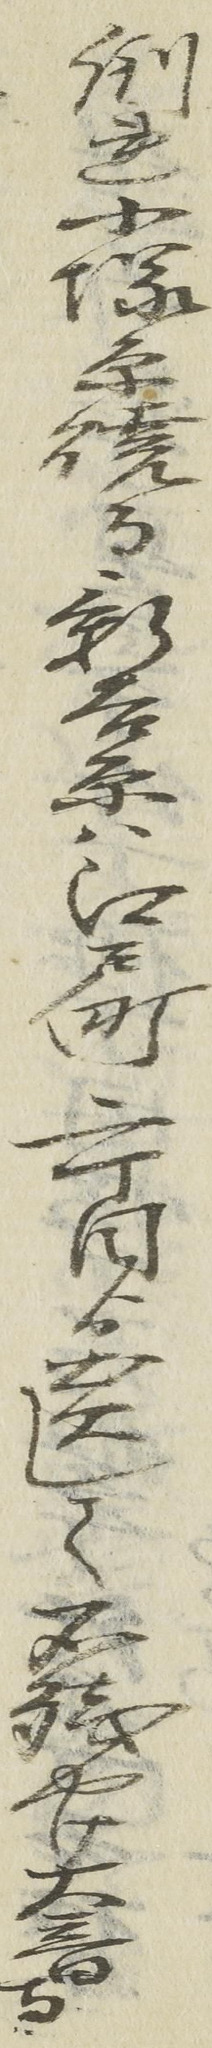倒れ小塚原焼る新吉原ハ江戸町二丁目ゟ出火して不残やけ大音寺
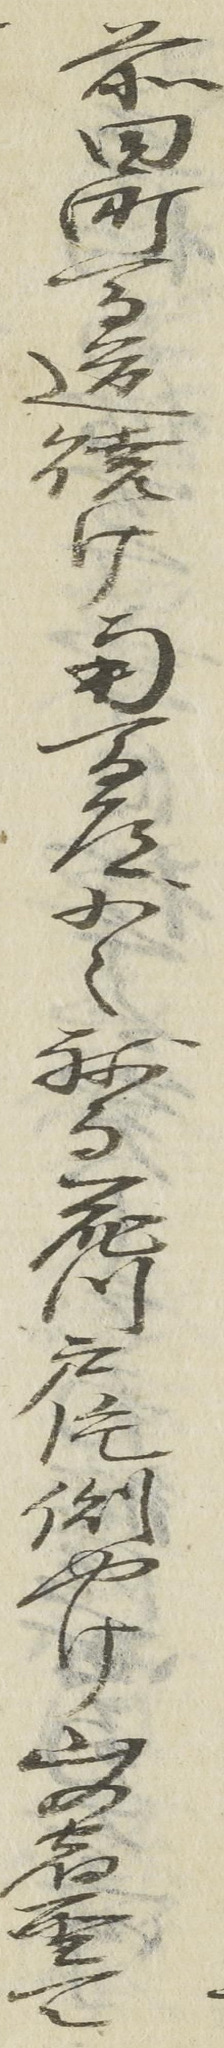前田町馬道焼南百道少し残る花川戸片倒やけ山の宿聖天
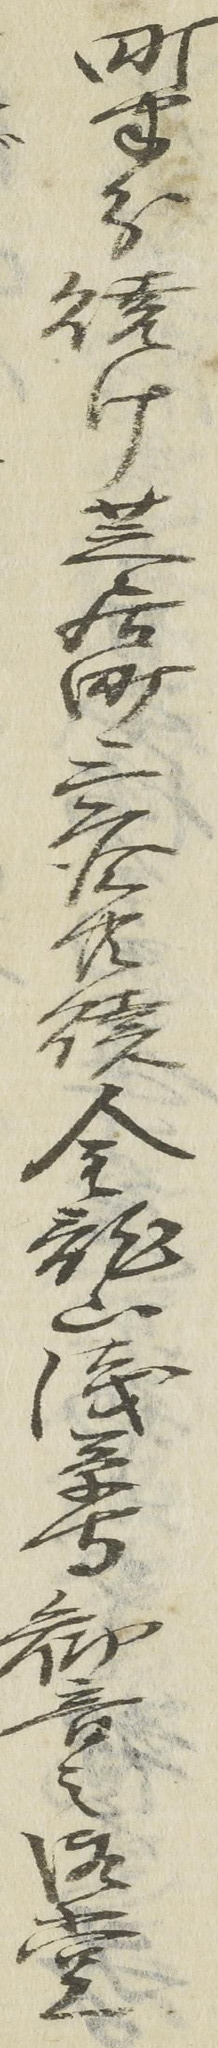町半分焼け芝居町三座共焼金龍山浅草寺観音之御堂
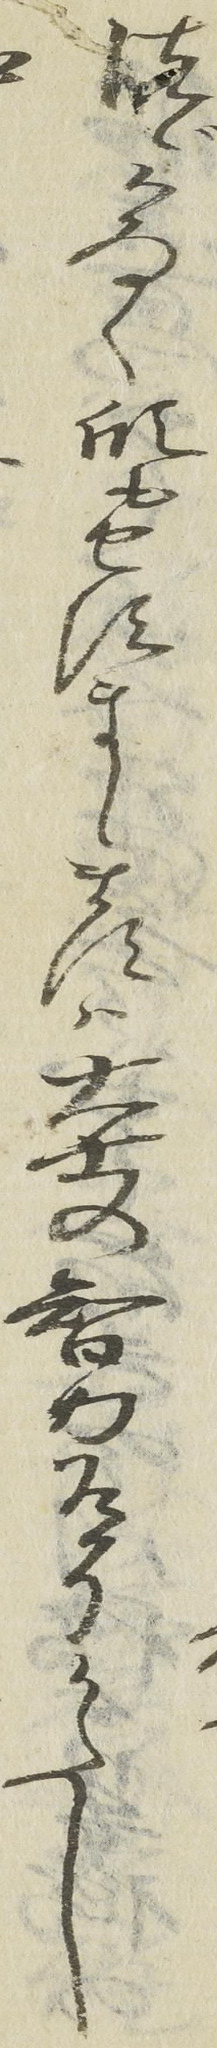つゞかなく傾もセすましますハ大士の智力有りかたし
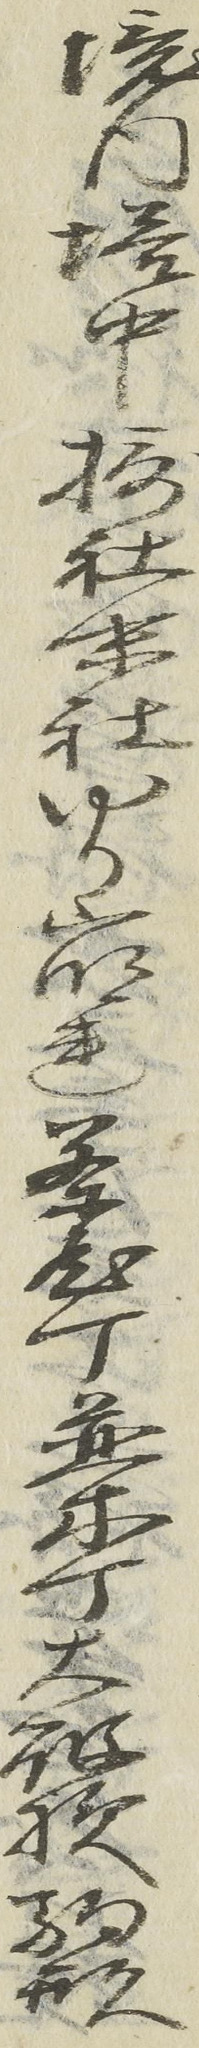境内塔中祓社末社ゆり崩れ茶屋丁並木丁大破損駒形
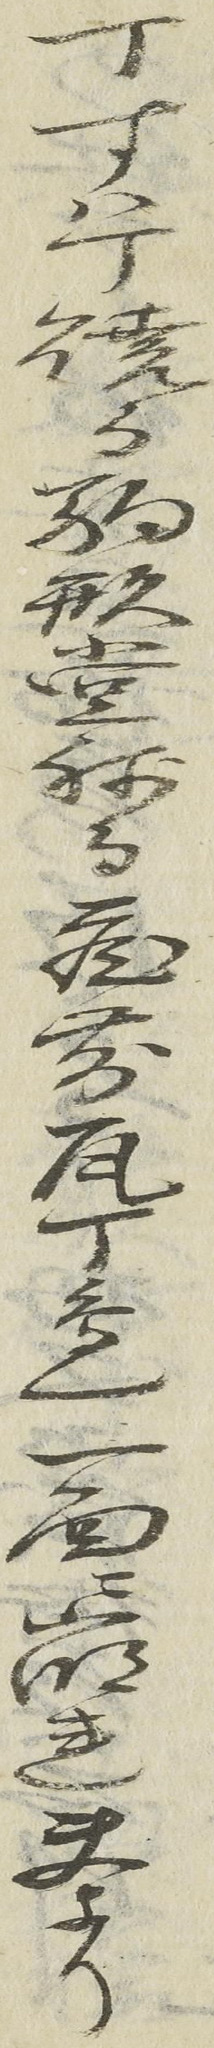丁すハ丁焼る駒形堂残る蔵前瓦丁辺一面ニ崩れ夫より
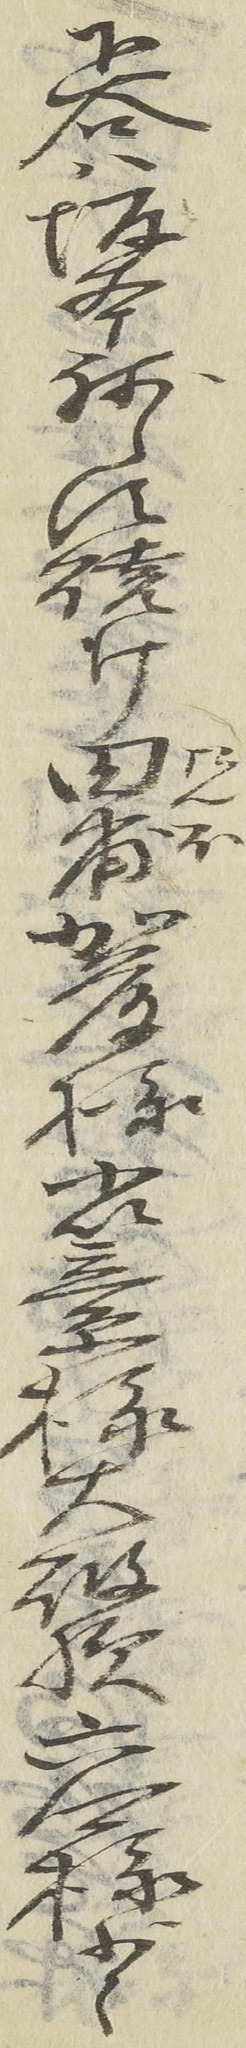下谷ハ坂本残らす焼け田甫加藤様小笠原様大破損六郷様少し
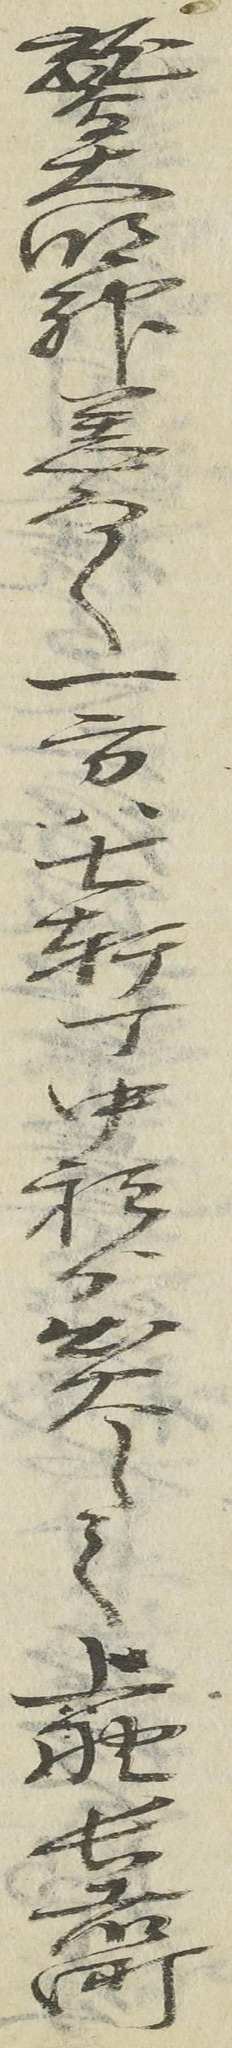鷲大明神恙なく一方ハ七軒丁中程ゟ出火して上野長者町
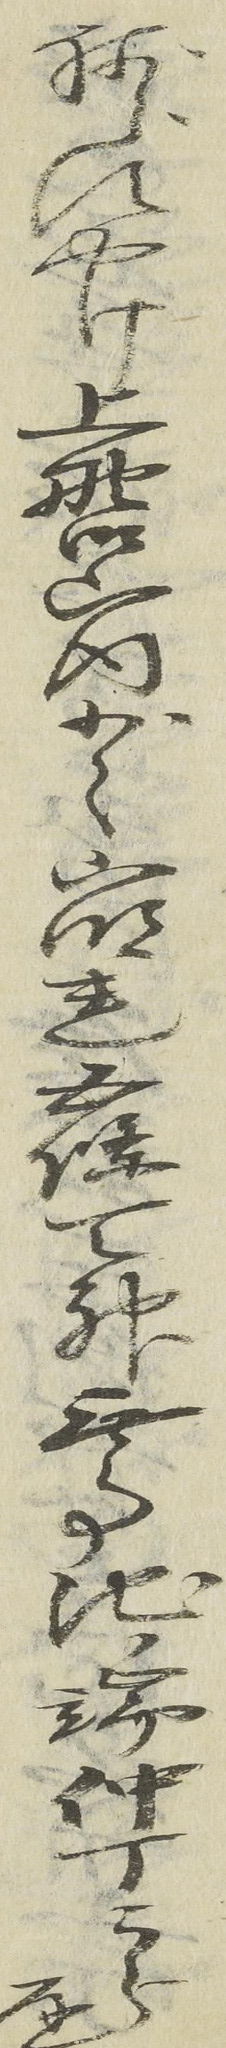残らすやけ上野御山内少し崩れ五條天神無事池ノ端仲丁うら通

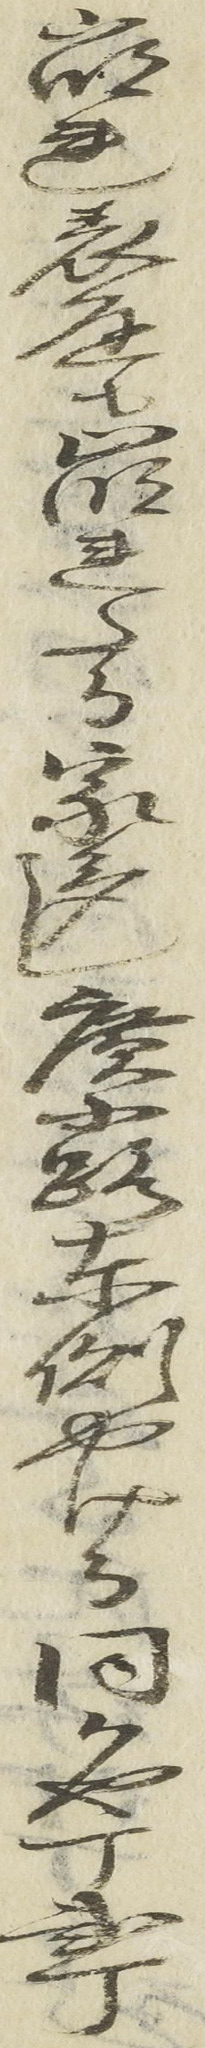崩れ表通りも崩れたる家多し広小路東側やける同ケや丁弐丁
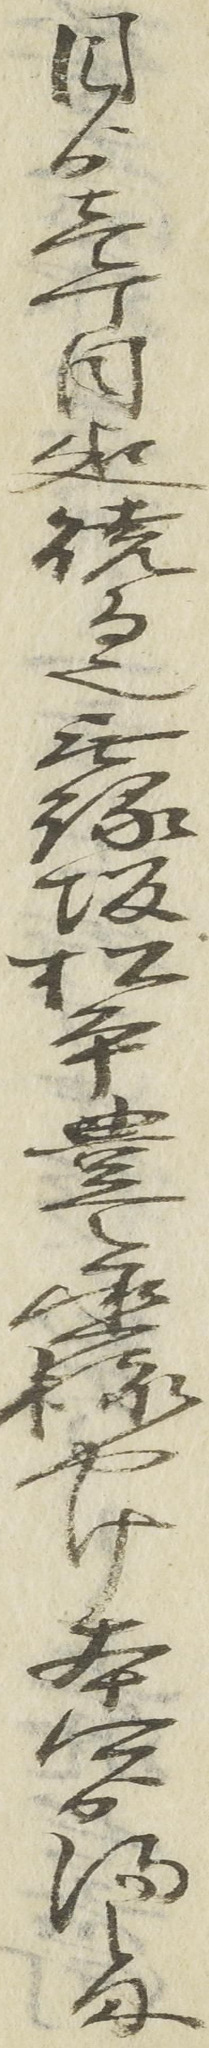目ゟ壱丁目迄焼る也無縁坂松平豊之丞様やけ本郷ゟ湯しま
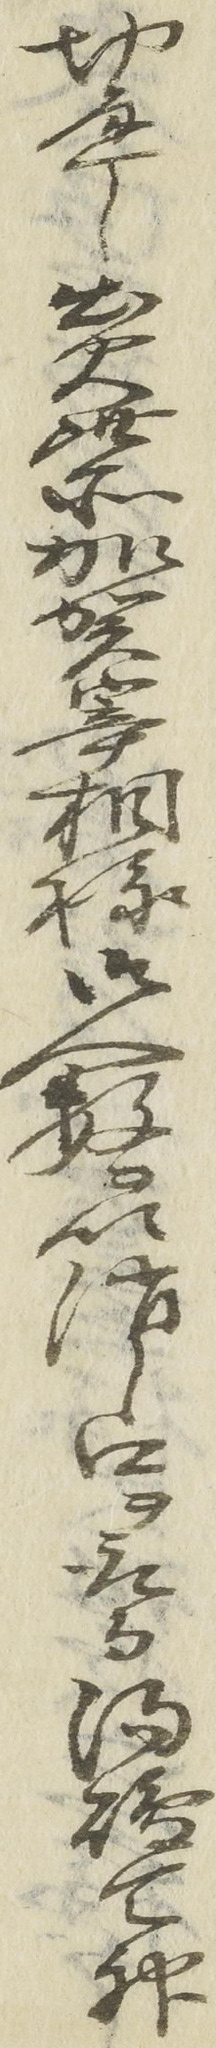切通し出火此所加賀宰相様御人数ヲ以消口ヲ取る湯嶋天神
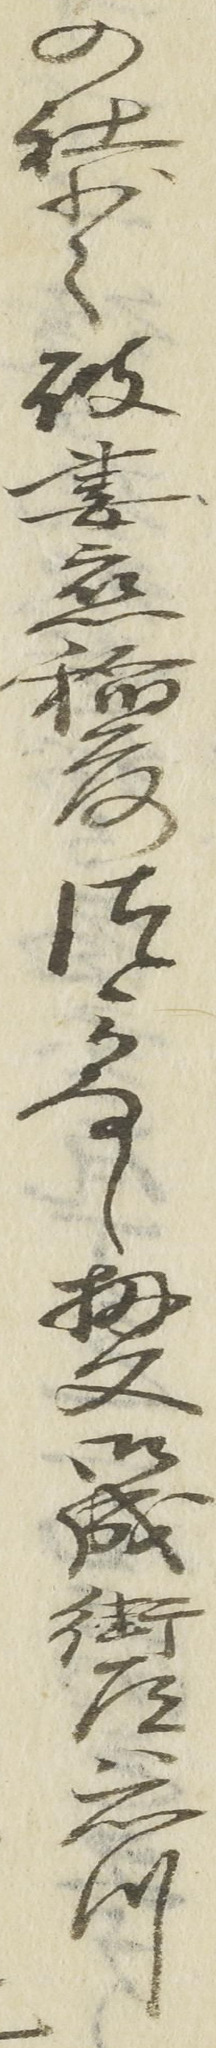の社少し破妻恋稲荷つゝかなし扨又御成街道ハ石川
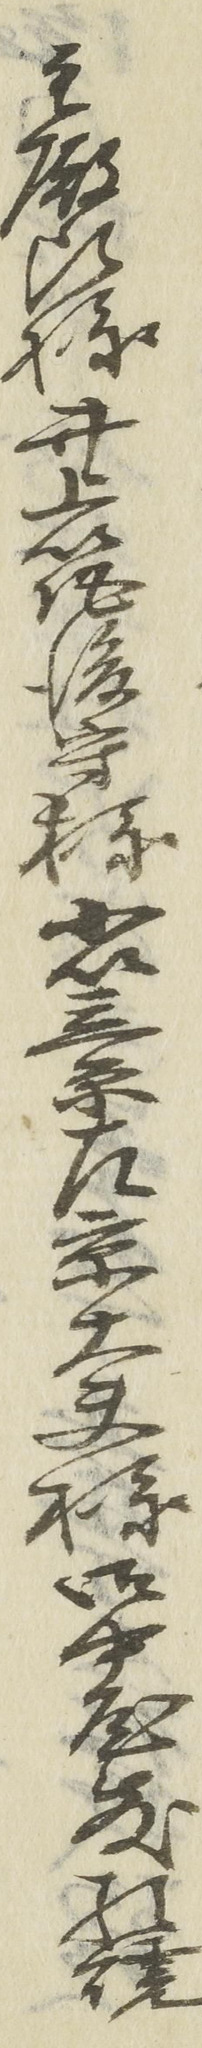主殿頭様井上筑後守様小笠原左京太夫様御中屋敷打焼
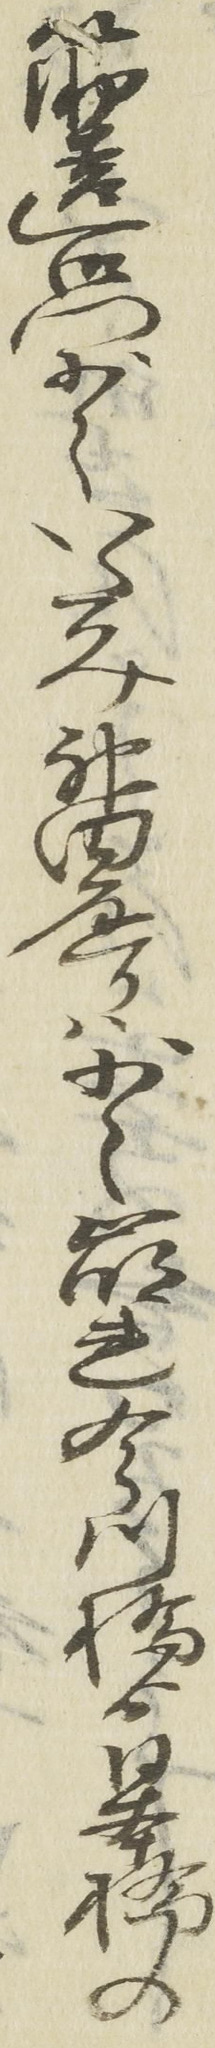筋違御門少しいたみ神田通りハ少し崩れ今川橋ゟ日本橋の
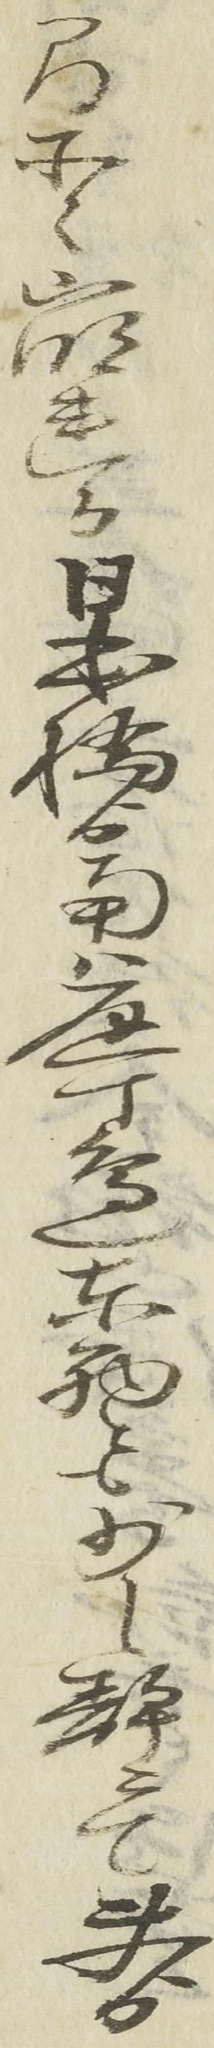間所〻崩れる日本橋ゟ南ハ通丁辺東西とも少し静ニて夫ゟ
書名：安政乙卯江戸大地震筆記　安政丙辰八月大阪大雷雨之記追加　安政三辰年七月松前辺大地震并八月大風雨記録
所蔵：東京大学地震研究所図書室 Earthquake Research Institute Library, The University of Tokyo, JAPAN
